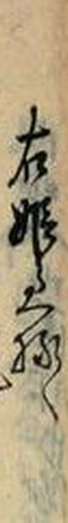右姫君様へ
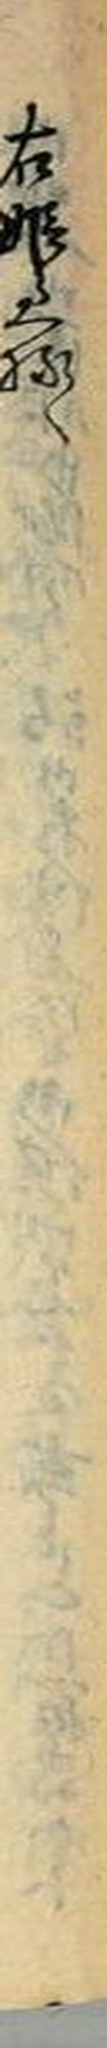右姫君様へ
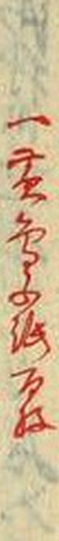桃「黄鳥子紙百枚
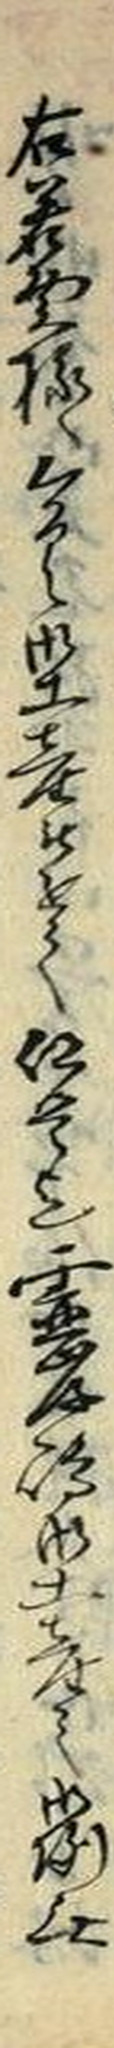右若殿様へ今日之御土産被進之但是迄霊岸嶋御土産之御例無
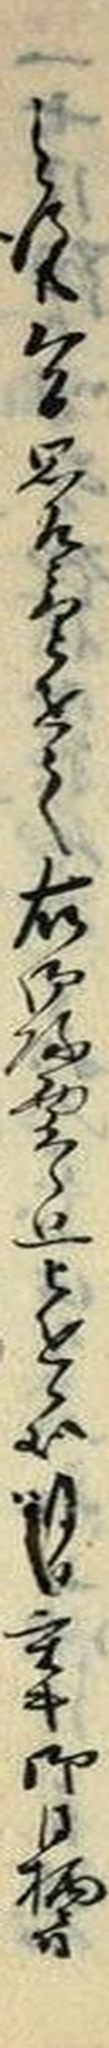之候得共今日思召ニ而被進之右御帰殿候上被進候処明日重キ御日柄ニ付
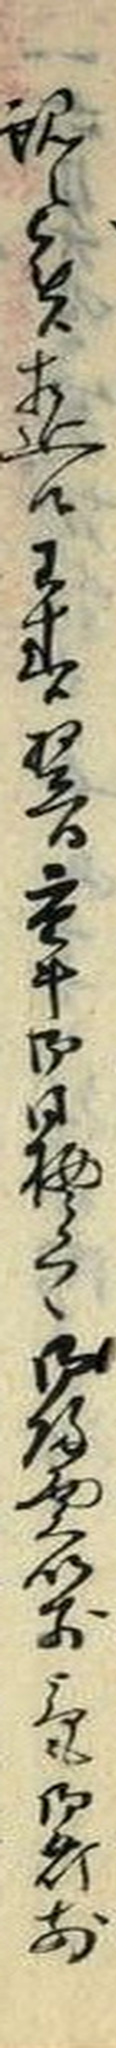蜆被進候ハ相止候已来ハ翌日重キ御日柄ニ候ハゝ御帰殿以前ニ而も御灯前
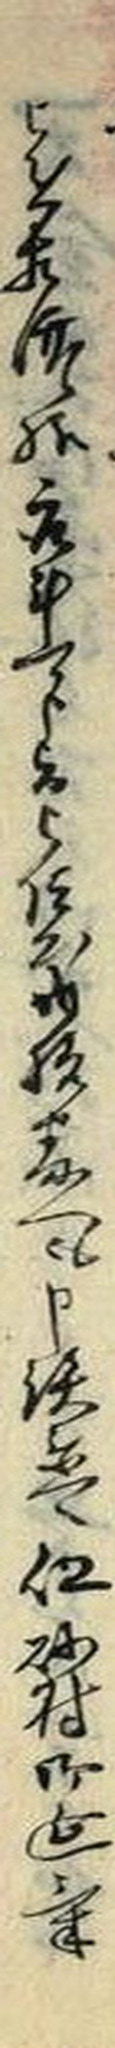被進相済候様取斗可申旨被仰出御膳番へも申談置候但砂村御延気
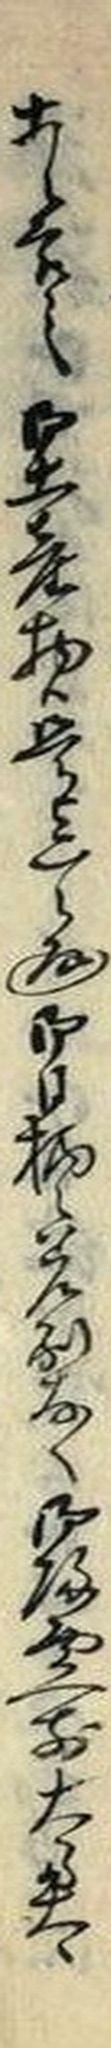等之節之御土産物ハ是迄之通御日柄ニ差別なく御帰殿前大奥へ
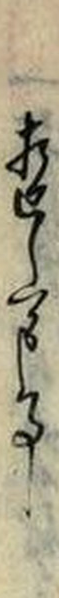相廻し可申事
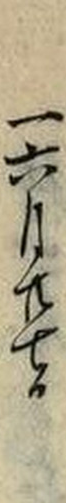一六月廿七日
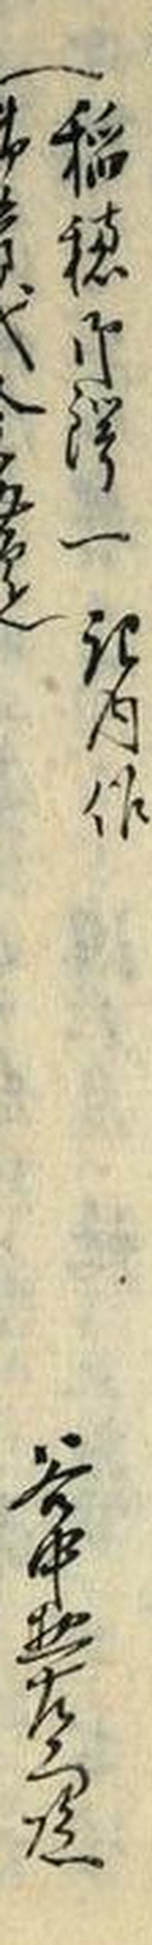稲穂御鍔一記内作谷中惣左衛門殿
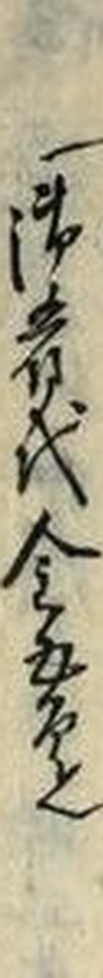御肴代金五百疋
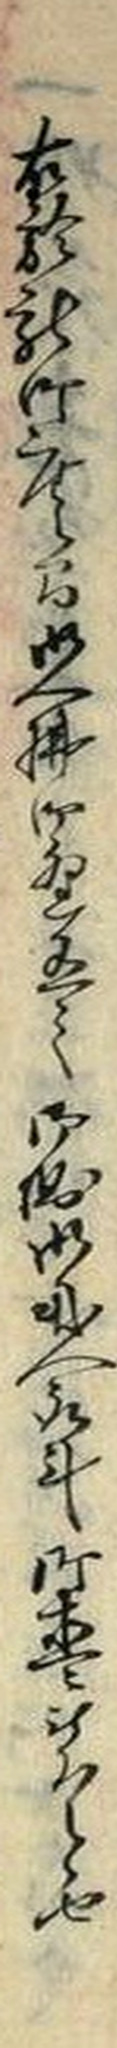右於新御座之間御人払御逢有之御側御用人取斗御直々被下候由
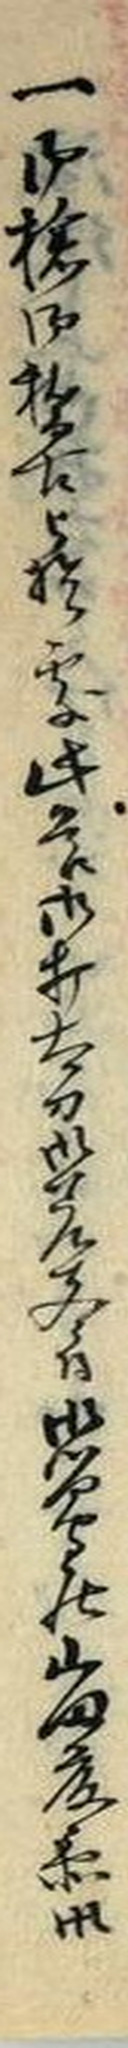一御槍御稽古被遊候処此節御打太刀御差支ニ付御留守居山田藤兵衛御

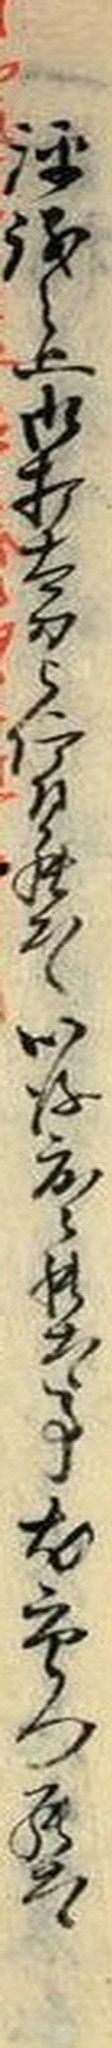評議之上御打太刀被仰付罷出候以後度々罷出候事尤市右衛門罷出候
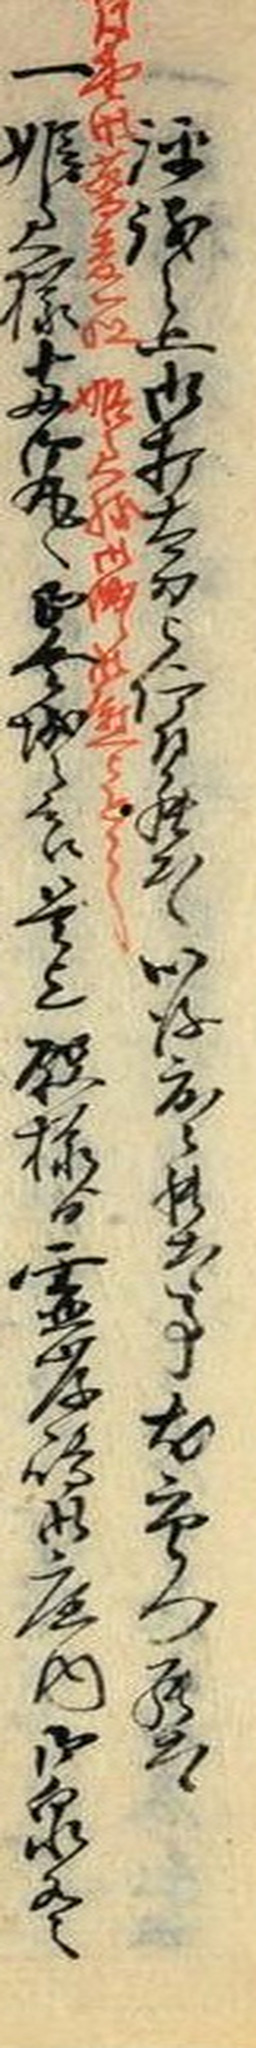一姫君様両御丸へ御登城之節是迄殿様ゟ霊岸嶋御庭内御泉水之
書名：少傅日録抄（斉承付側向頭取日記、在府）
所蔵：福井県文書館 Fukui Prefectural Archives
